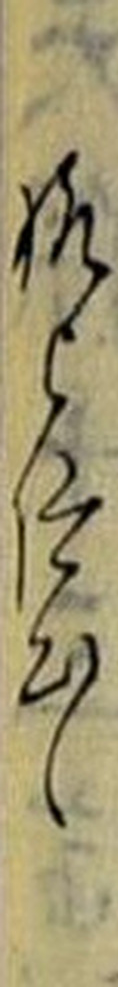様被仰出候
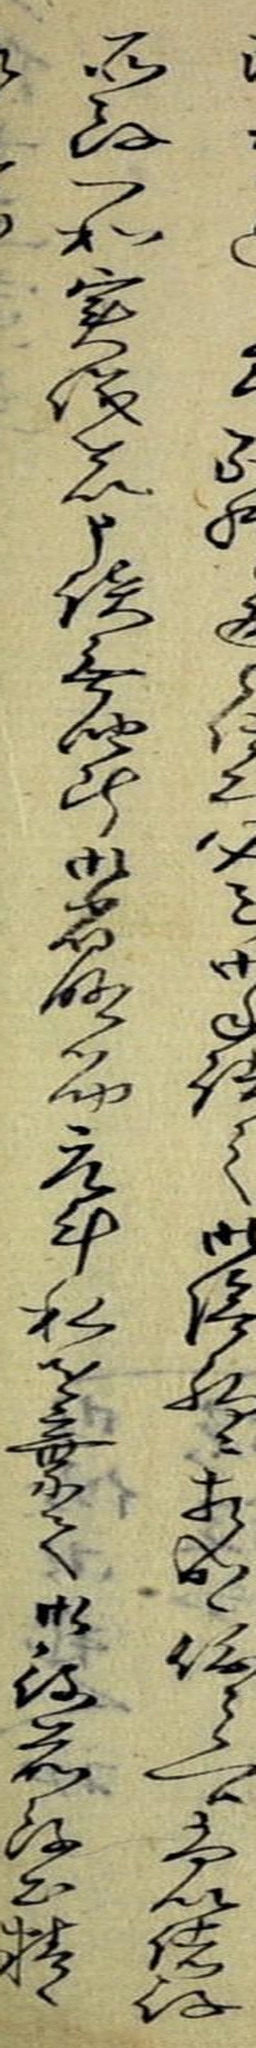所致一和実儀を以申談無由断御省略筋取斗私を棄て御役前致出精候
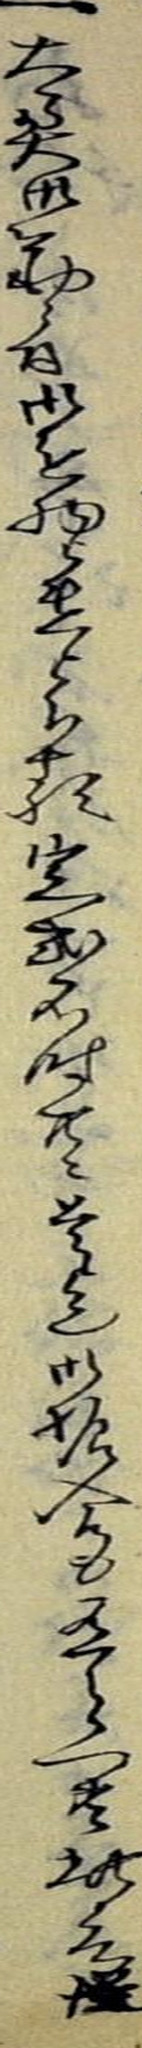一大奥御勤に付御進物被遣被下類定式不時共に是迄御振合も有之候へ共此度
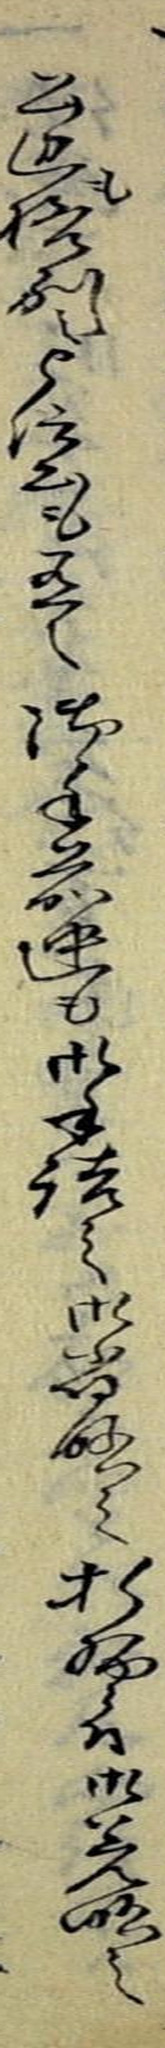公辺も各別之被仰出も有之御手前迚も御手詰之御省略之折柄に付御差略之
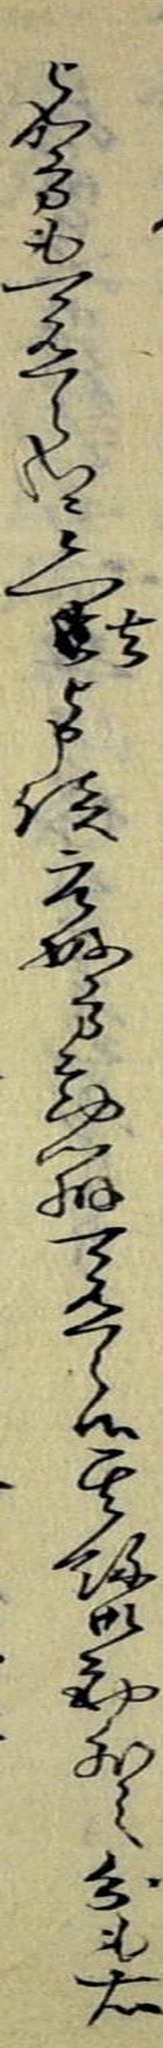被成方も可有之候哉に候へ被申談取扱方勘弁可有之候其餘御勤外之分も右
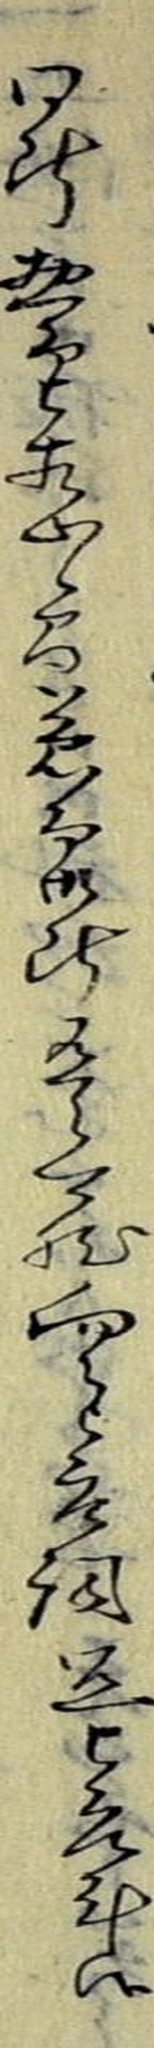同断惣而被相止候間兼而御断有之可然向々被取調宜被取斗候
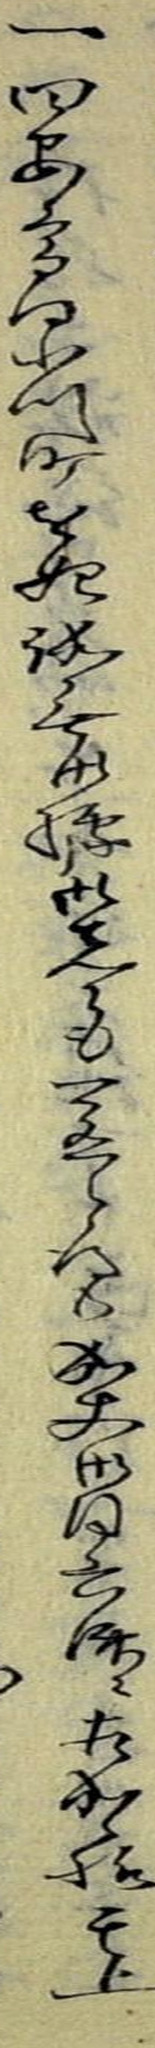一田安髙田小川町を始誠無御拠御先にも可有之候得共成丈御目六済に相成候様其上
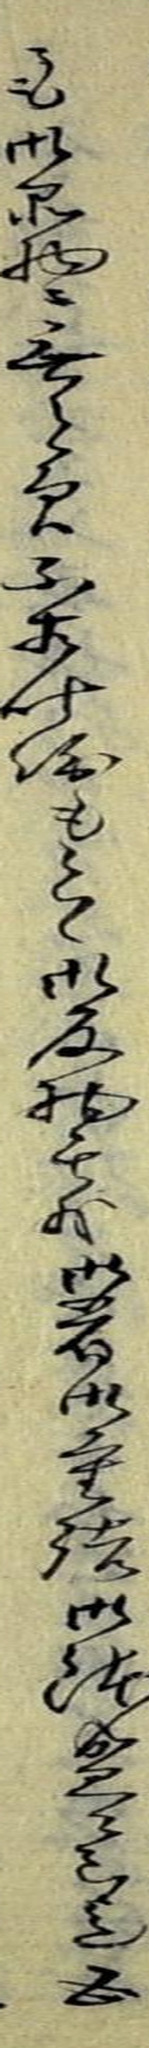にも御品物に無之候而は不相叶儀も候はヽ御反物其外御肴御重詰御鉢盛に至迄五
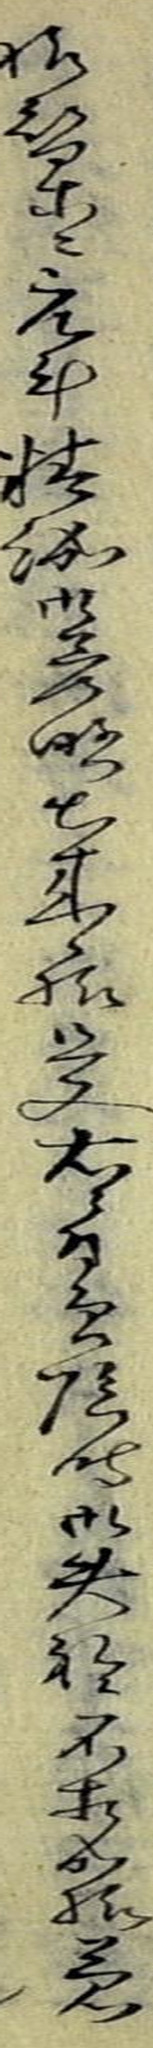様替等に取斗精誠御差略出来候様且又右に付而は臨時御失程不相成様兼
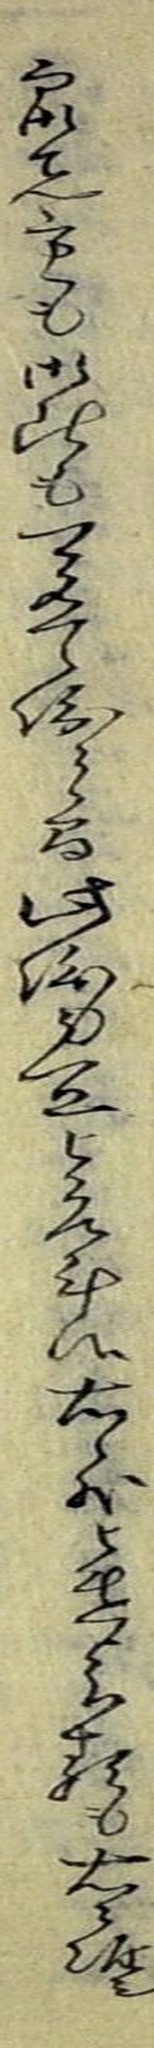而御先方へも御断も可有之儀に候間此儀も宜被取斗候右之外被遣被下類も右に准し
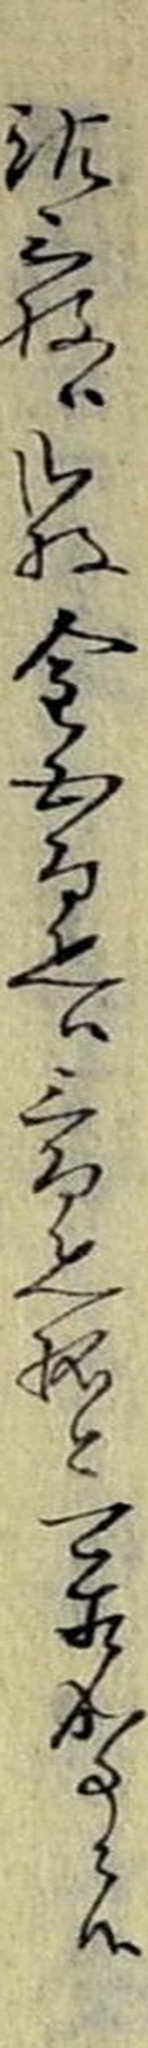銀三枚は弐枚金五百疋は三百疋抔と可相成事
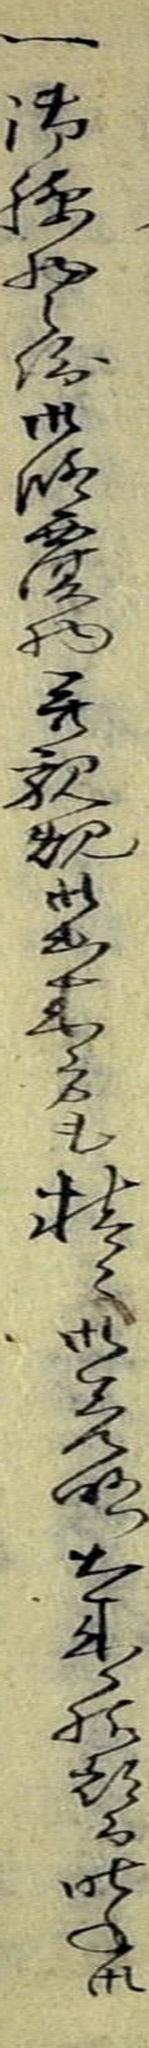一御腰物之儀御修覆物并新規御出来方も精々御差略出来候様都而昨年御
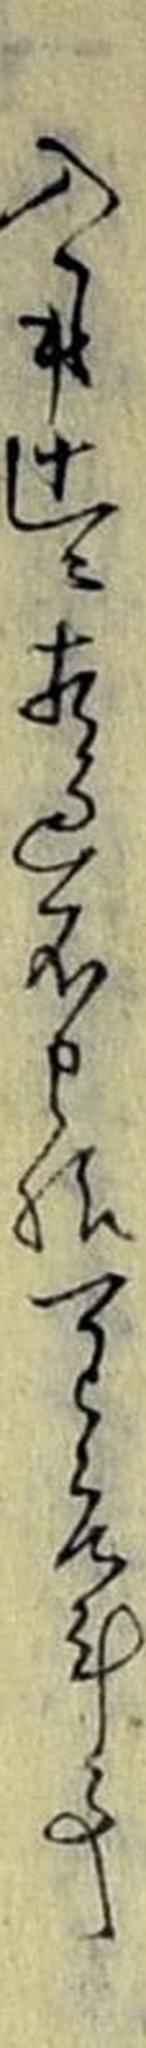入用辻に相過不申様可被取斗候事
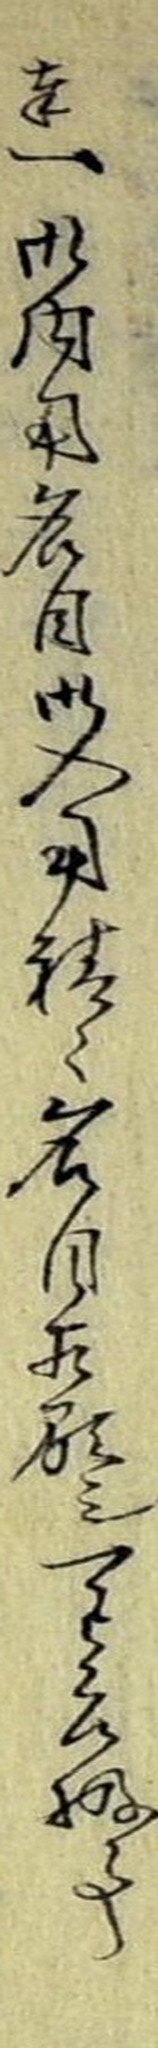奉一御内用名目御入用精々名目相顕し可被取扱事
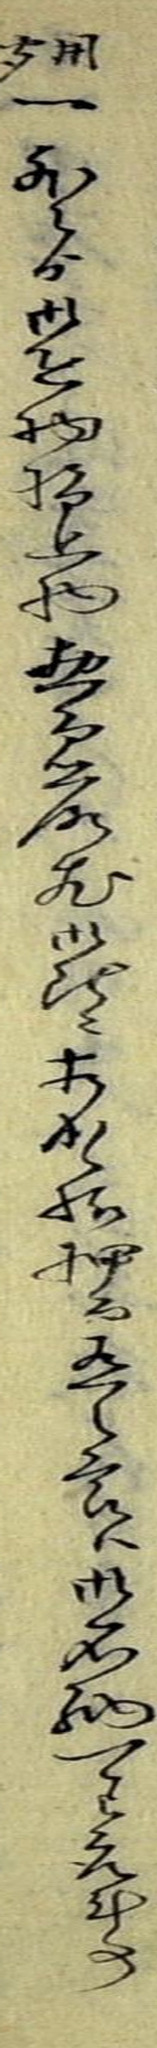御聞一外々ゟ御進物指上物惣而厳敷御断に相成候様押而有之節は御不納可被取斗事
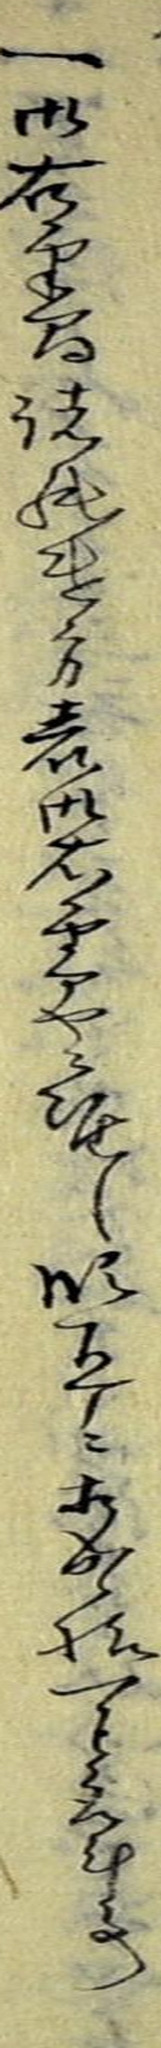一御右筆間諸紙遣方表御右筆部やに准し段下ヶに相成候様可被取斗事
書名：命令之部 六
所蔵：福井県文書館 Fukui Prefectural Archives
